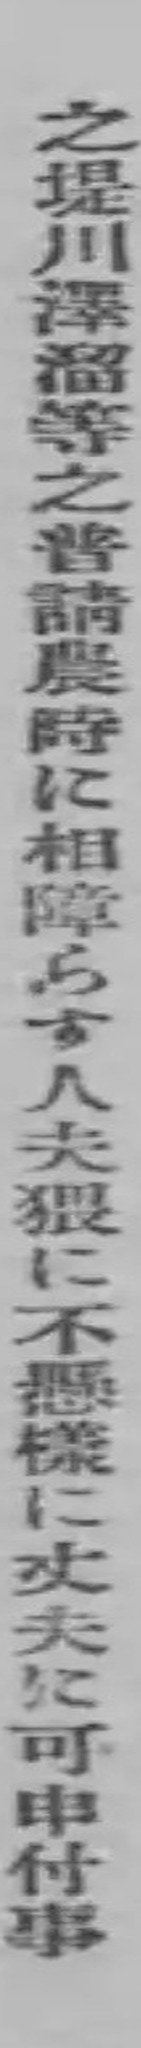之堤川澤溜等之普請農時に相障らす人夫猥に不懸様に丈夫に可申付事
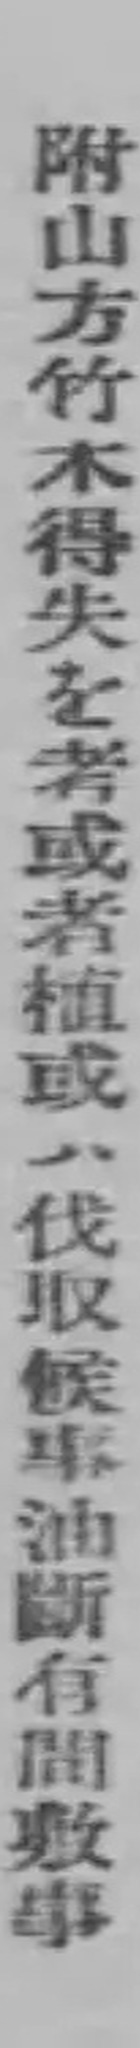附山方竹木得失を考或者植或は伐取候事油断有間敷事
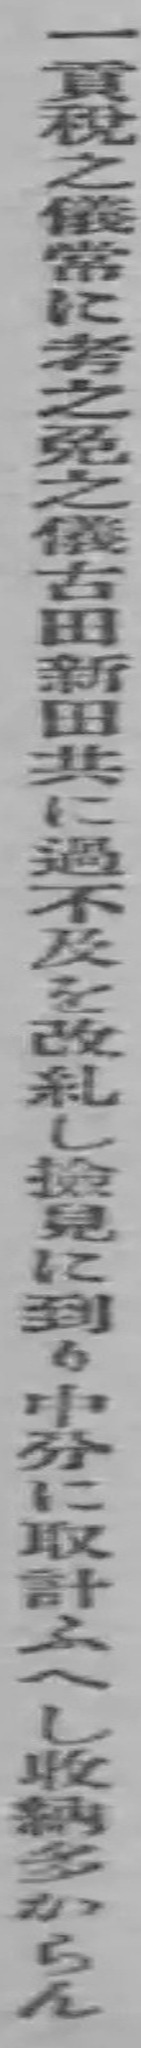一貢税之儀常に考之免之儀古田新田共に過不及を改糺し検見に到り中分に取計ふへし収納多からん

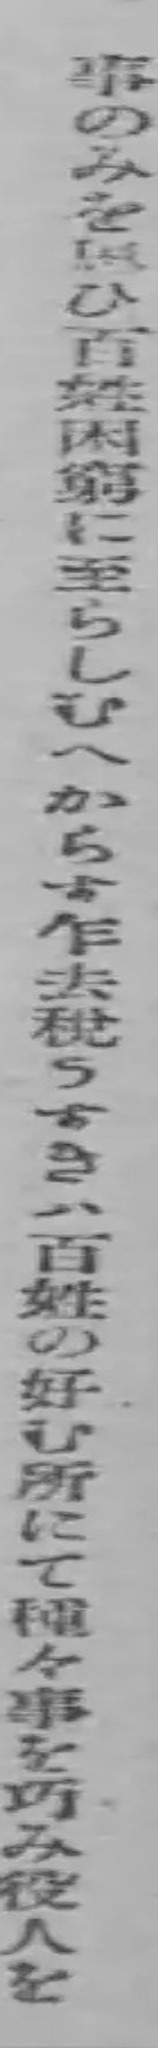事のみを思ひ百姓困窮に至らしむへからす乍去税うすきは百姓の好む所にて種々事を巧み役人を
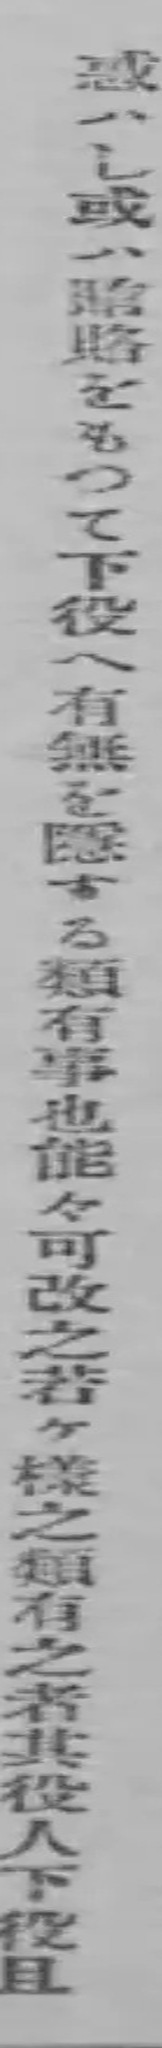惑はし或は賄賂をもつて下役へ有無を隠する類有事也能々可改之若ケ様之類有之者其役人下役且
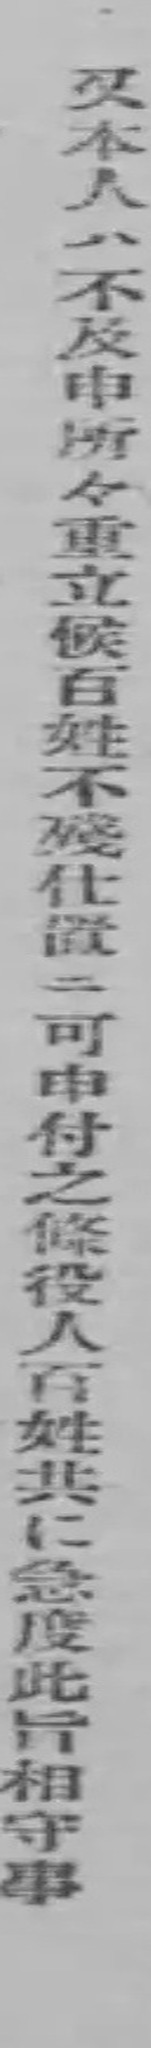又本人は不及申所々重立候百姓不残仕置ニ可申付之条役人百姓共に急度此旨相守事
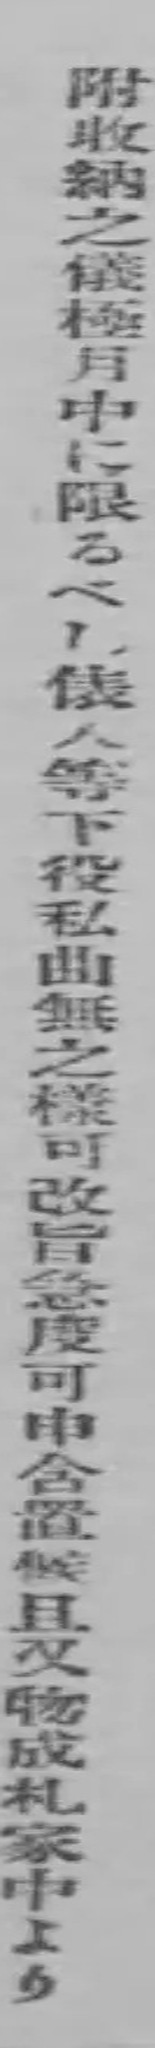附収納之儀極月中に限るべし俵入等下役私曲無之様可改旨急度可申含置候且又物成札家中より
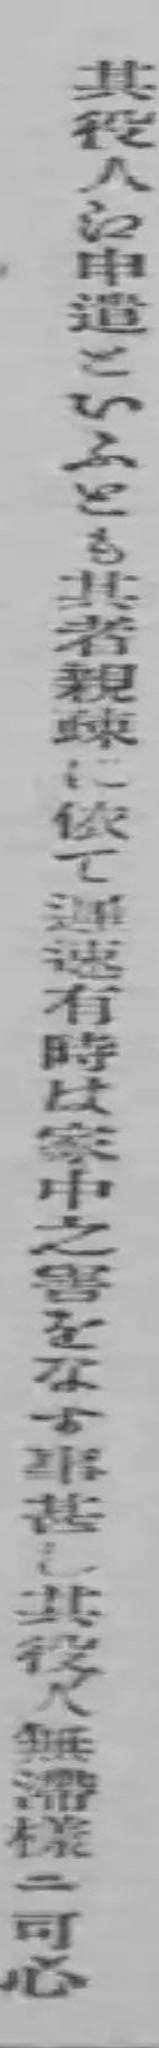其役人え申遣といふとも其者親疎に依て遅速有時は家中之害をなす事甚し其役人無滞様ニ可心
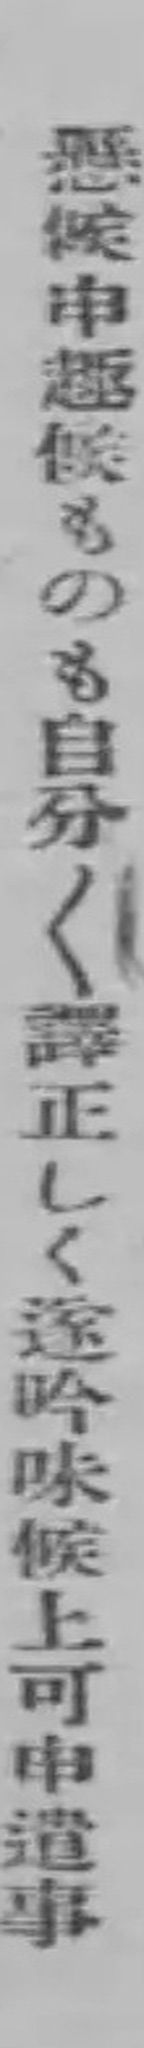懸候申趣候ものも自分〳〵訳正しく遂吟味候上可申遣事
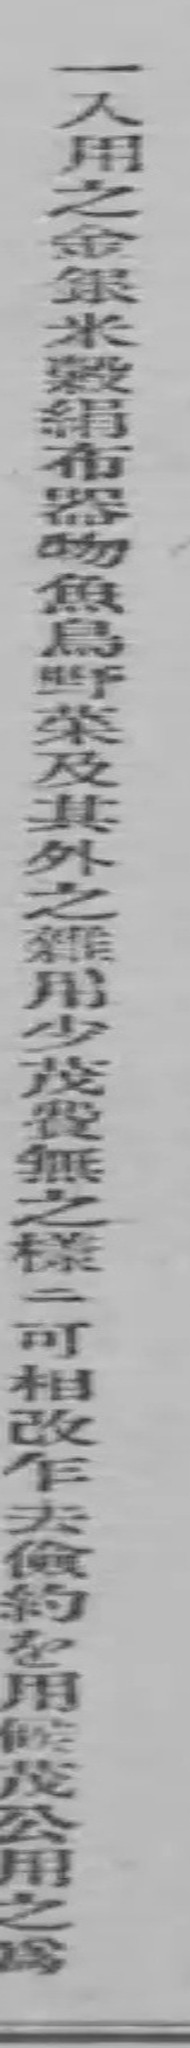一入用之金銀米穀絹布器物魚鳥野菜及其外之雑用少茂費無之様ニ可相改乍去倹約を用候茂公用之為
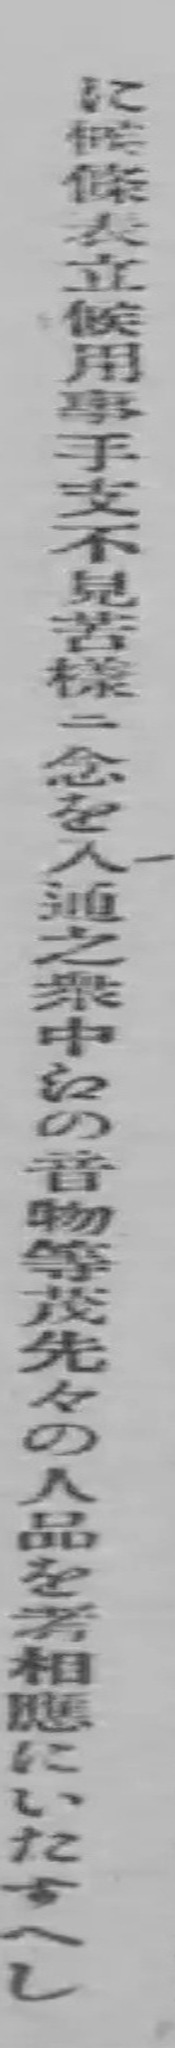に候条表立候用事手支不見苦様ニ念を入通之衆中えの音物等茂先々の人品を考相応にいたすへし
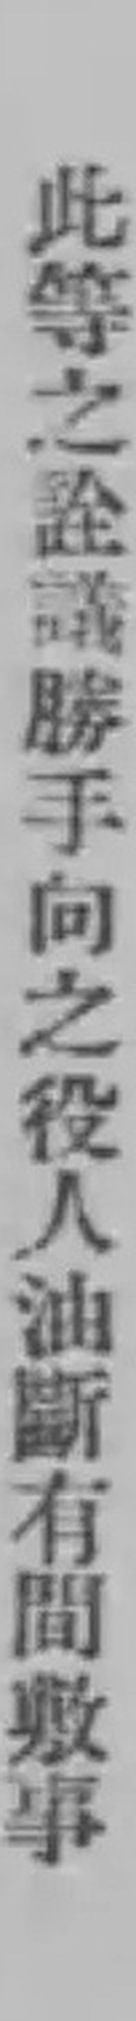此等之詮議勝手向之役人油断有間敷事
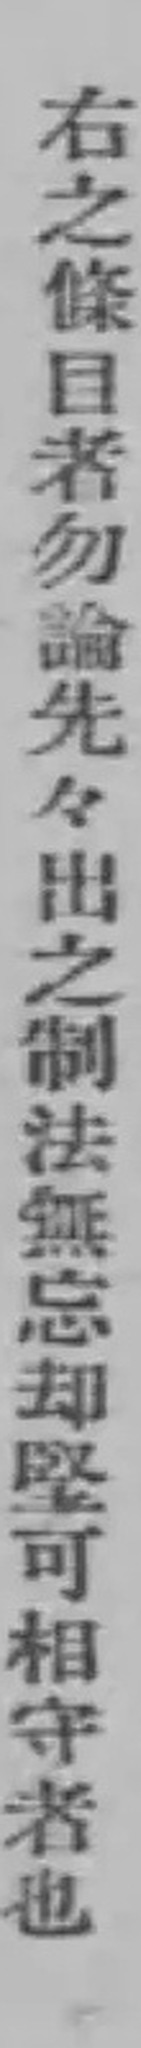右之条目者勿論先々出之制法無忘却堅可相守者也
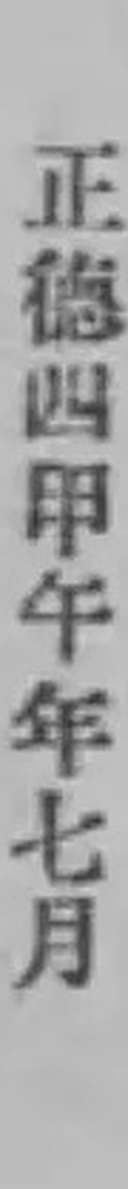正徳四甲午年七月日
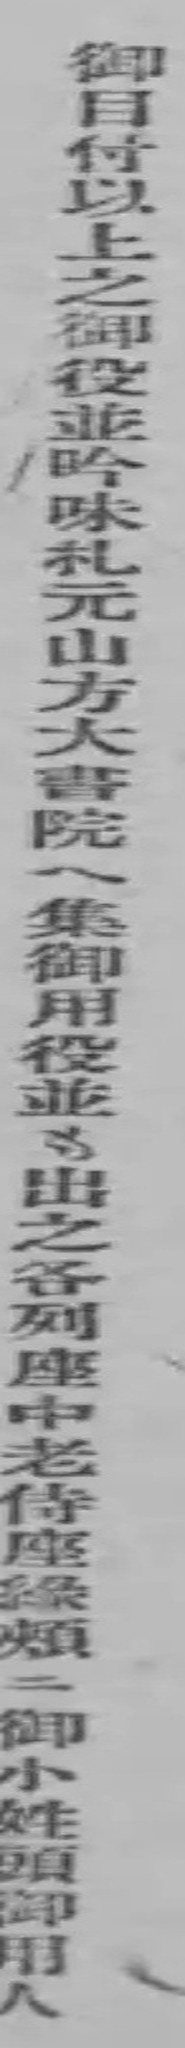御目付以上之御役並吟味札元山方大書院へ集御用役並も出之各列座中老侍座縁頬ニ御小姓頭御用人
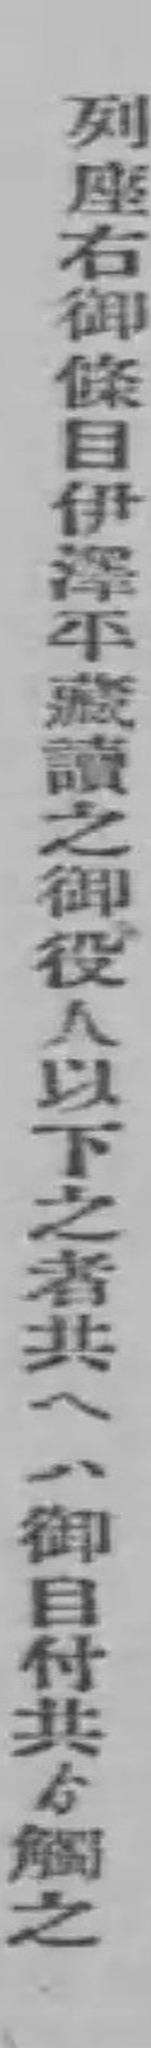列座右御条目伊澤平蔵読之御役人以下之者共へは御目付共ゟ触之
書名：豊橋市史談
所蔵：国立国会図書館 National Diet Library, JAPAN
